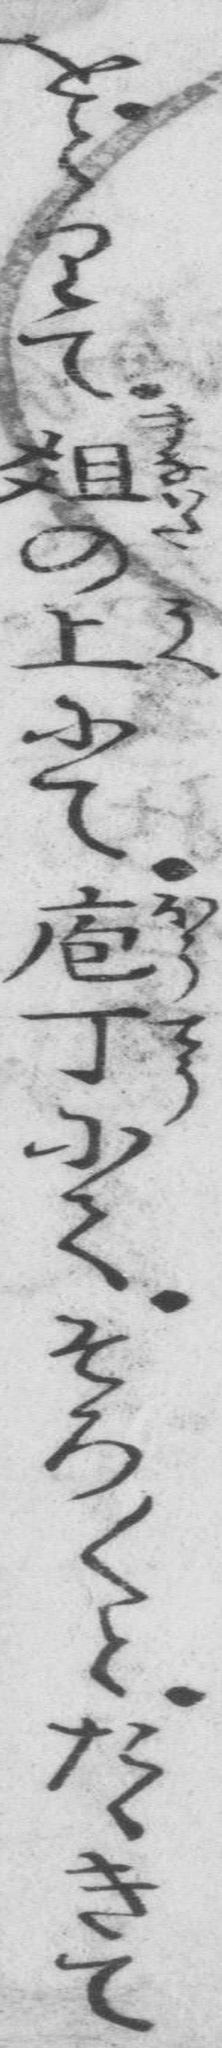を。とりて。俎の上にて。包丁にて。そろ〳〵と。たゝきて
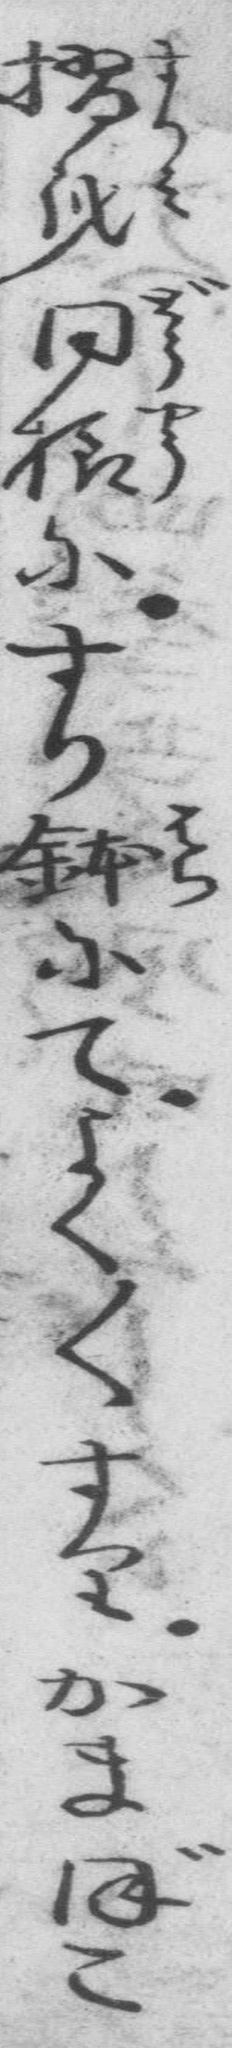摺身同様に。すり鉢にて。よく〳〵すり。かまぼこ
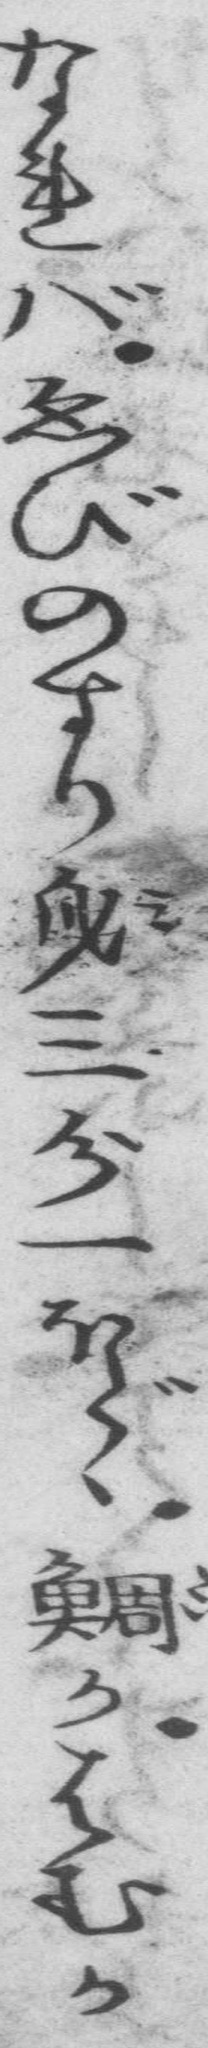なれば。ゑびのすり身三分一ほどゝ。鯛か。はむか
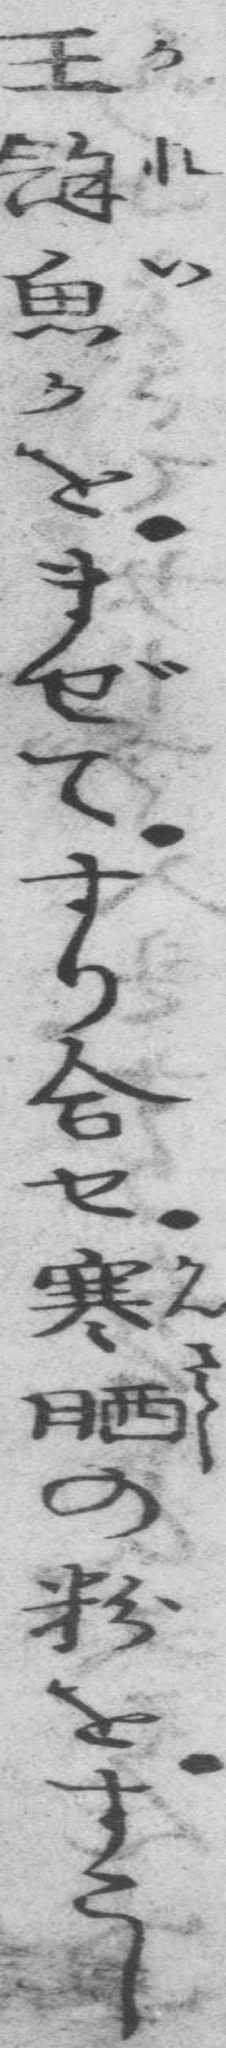王余魚かを。まぜて。すり合せ。寒晒の粉を。すこし

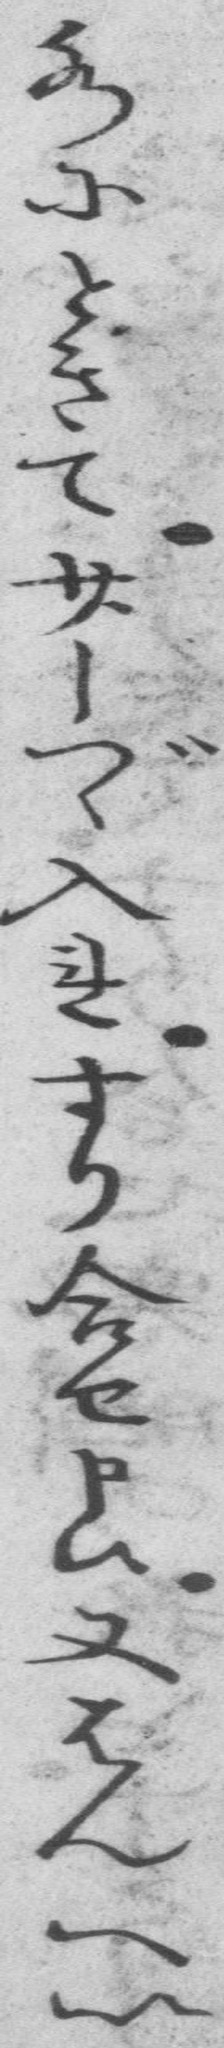水にときて。少しづゝ入れ。すり合せ申候。又はんへい
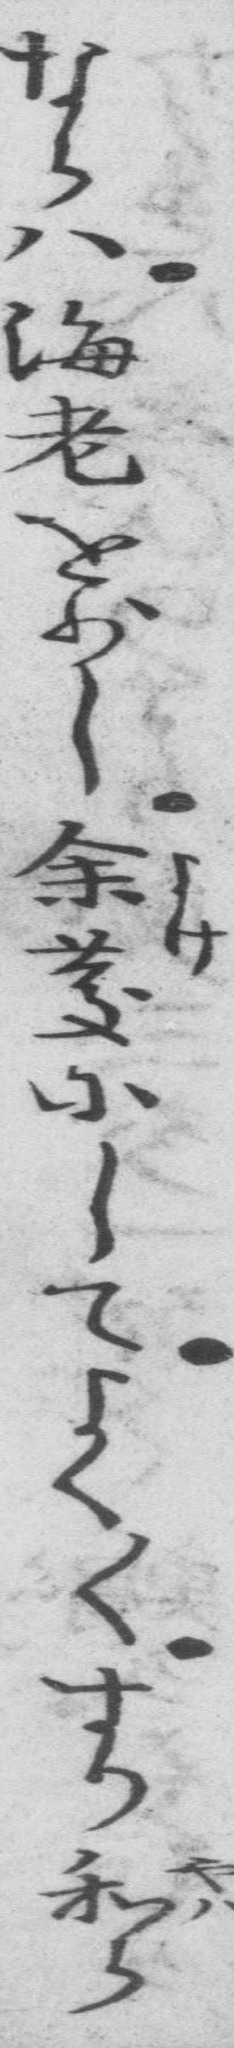ならは。海老を少し。余慶にして。よく〳〵。すり和ら
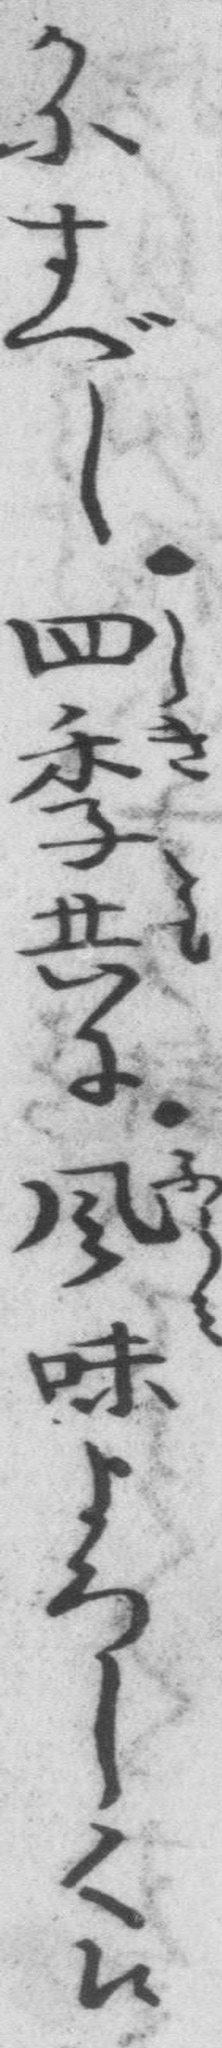かにすべし。四季共に。風味よろしく候
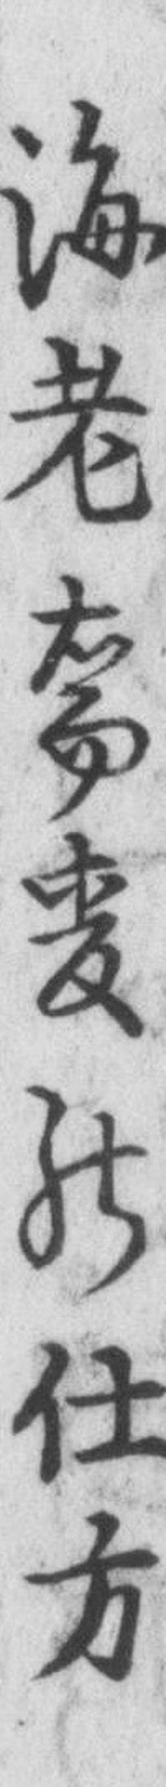海老蕎麦の仕方
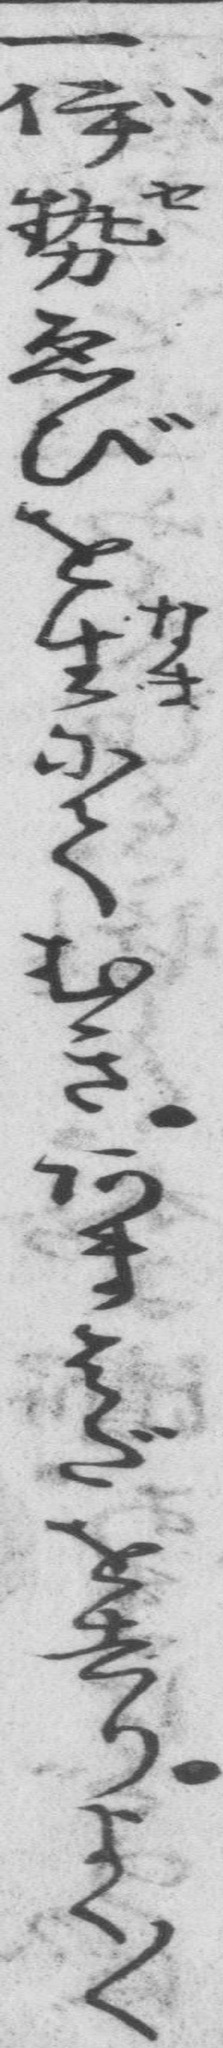一伊勢ゑびを生にてむき。あまはだを去り。よく〳〵
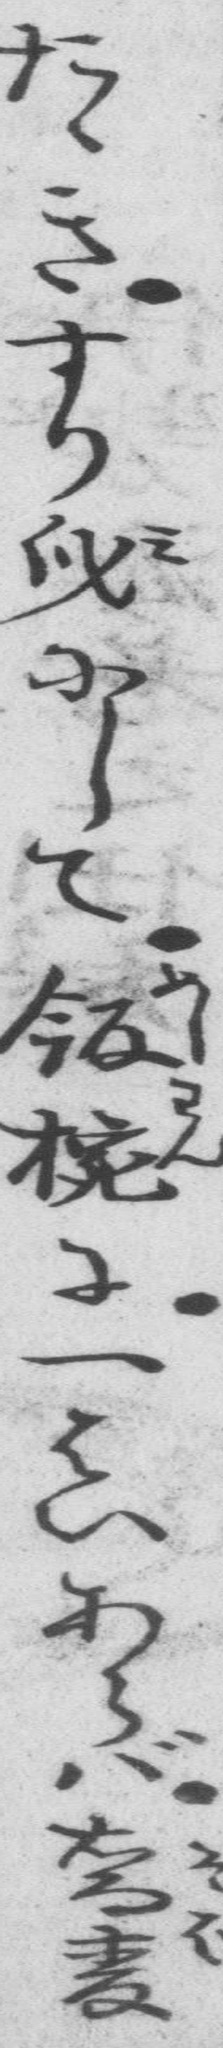たゝき。すり身にして。飯椀に。一はいあらば。蕎麦
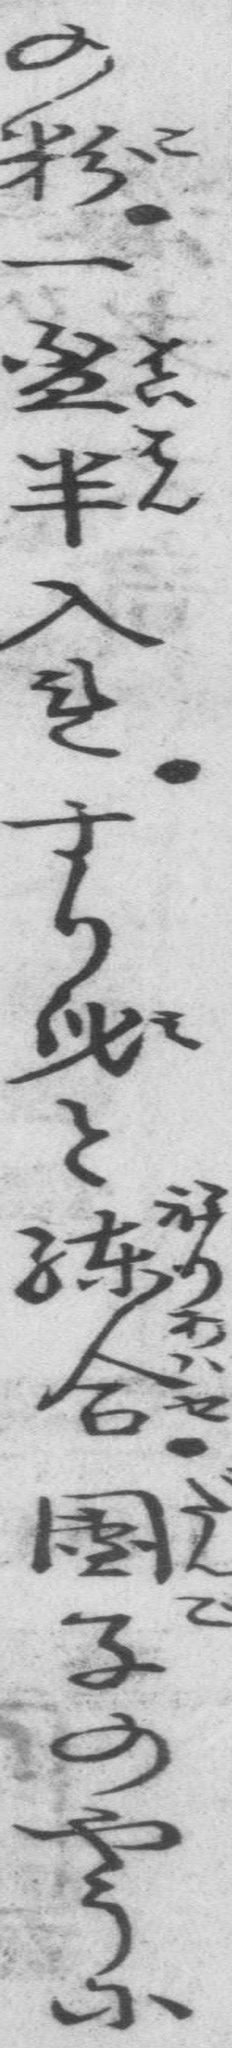の粉。一盃半入れ。すり身と練合。団子のやうに
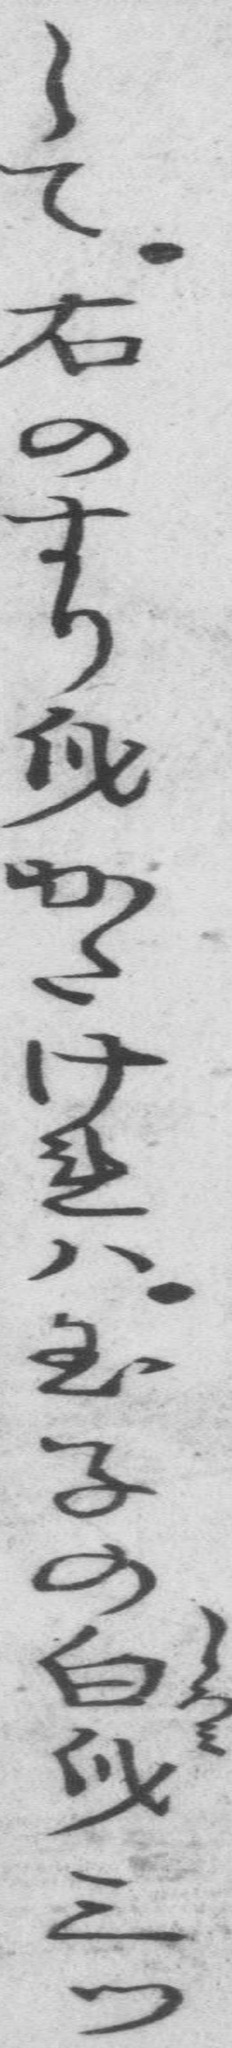して。右のすり身かたけれは。玉子の白身三ツ
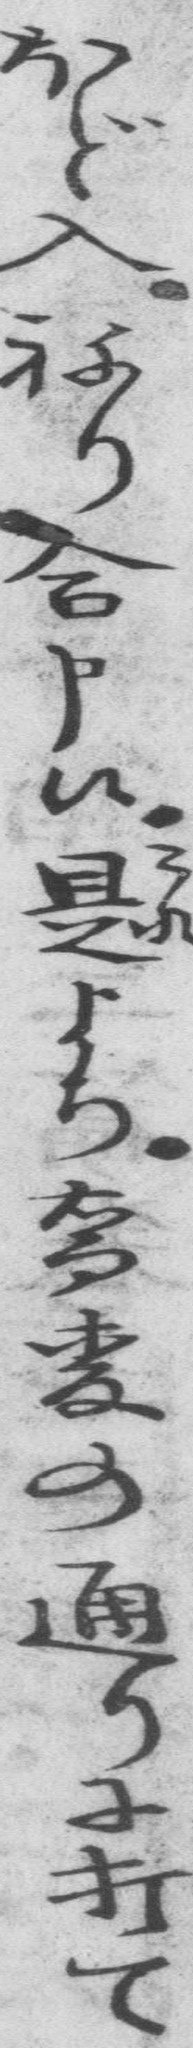ほど入。ねり合申候。是より。蕎麦の通りに打て
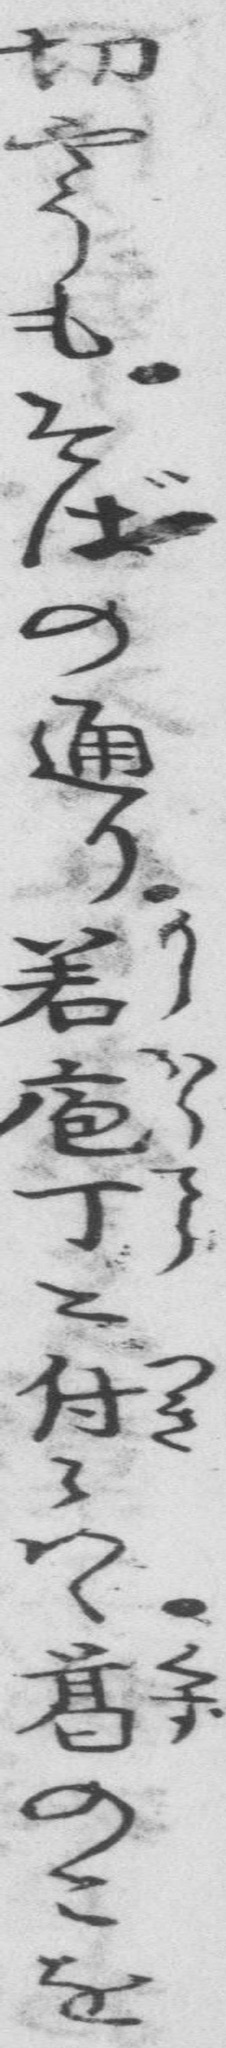切やうも。そばの通り。若包丁に付候はゝ。葛のこを
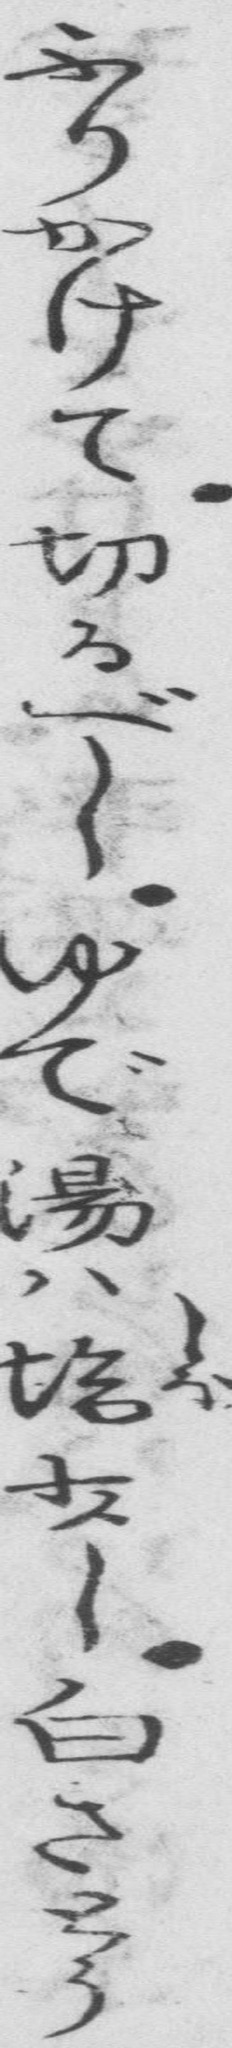ふりかけて。切るべし。ゆで湯は塩少し。白さとう
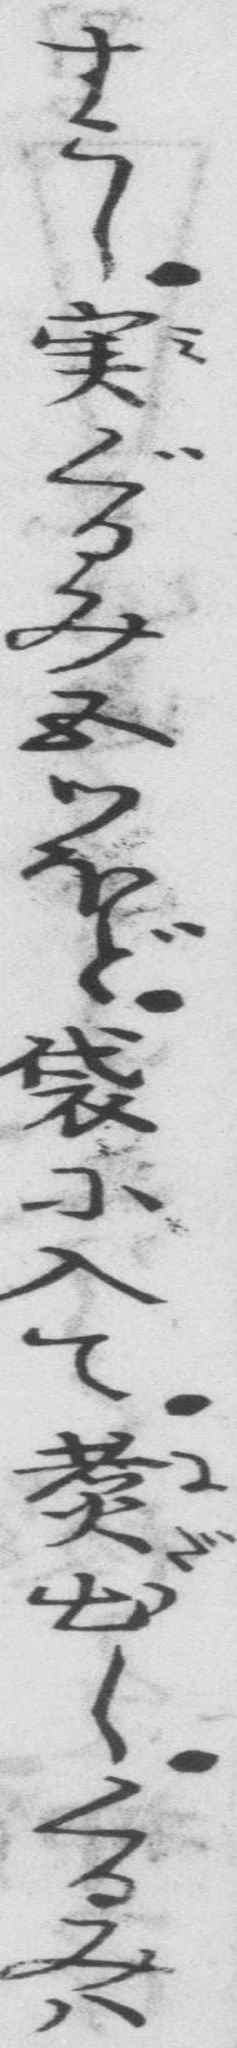すこし。実ぐるみ五ツほど。袋に入て。煮出し。くるみは
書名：萬寳料理秘密箱
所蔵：大阪府立大学学術情報センター 国文学研究資料館
